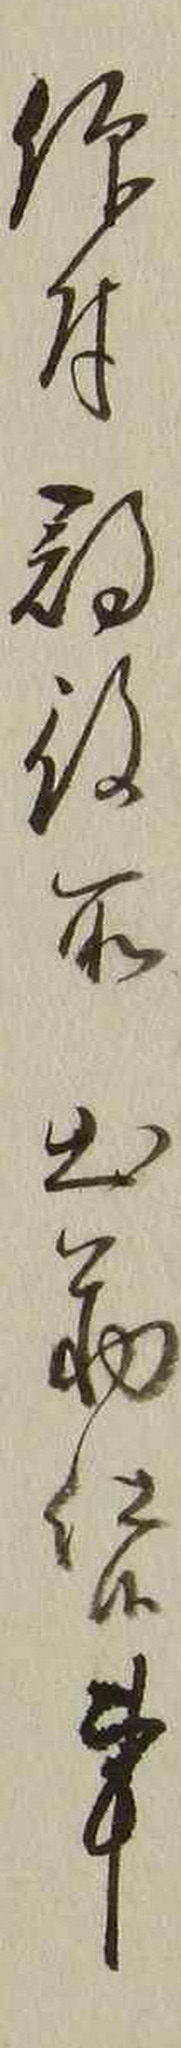仰付尋役所出勤仕候事
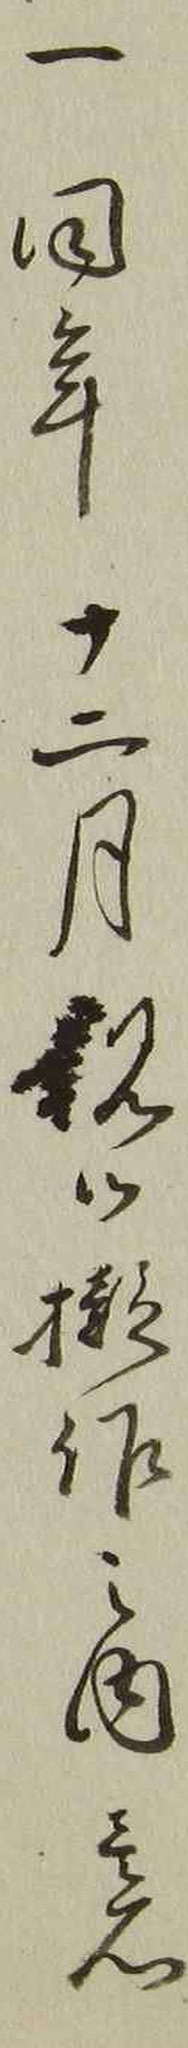一同年十二月親御擬作之内壱石
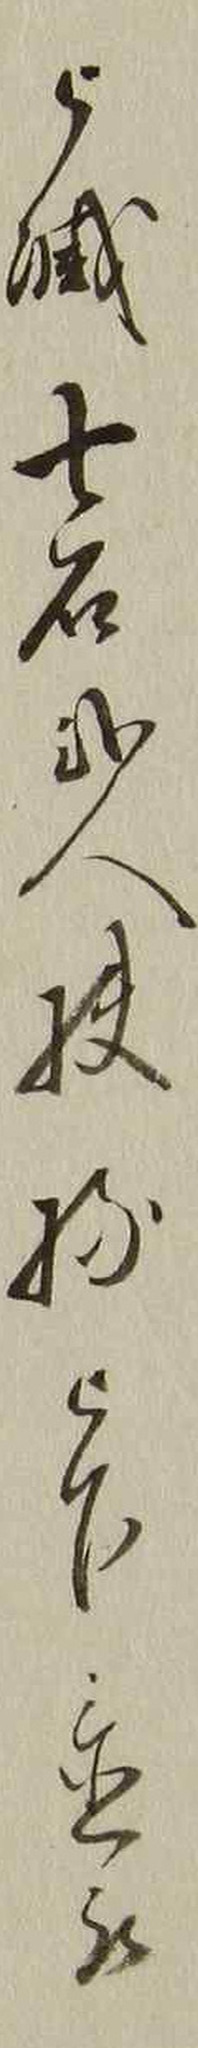被減七石弐人扶持被下置被
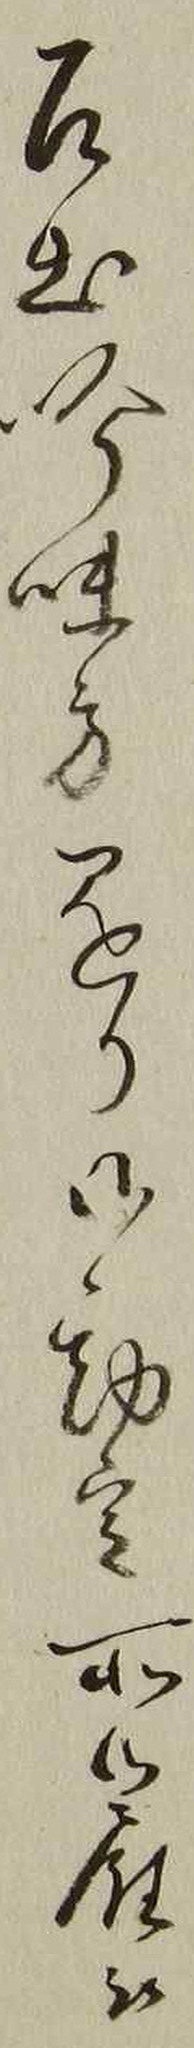召出吟味方懸り御勘定所御雇被
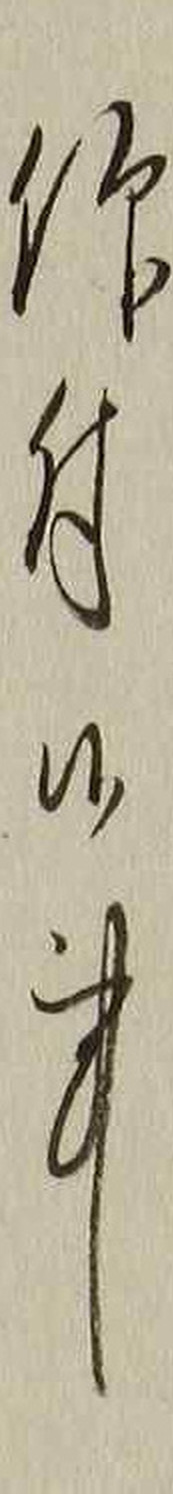仰付候事
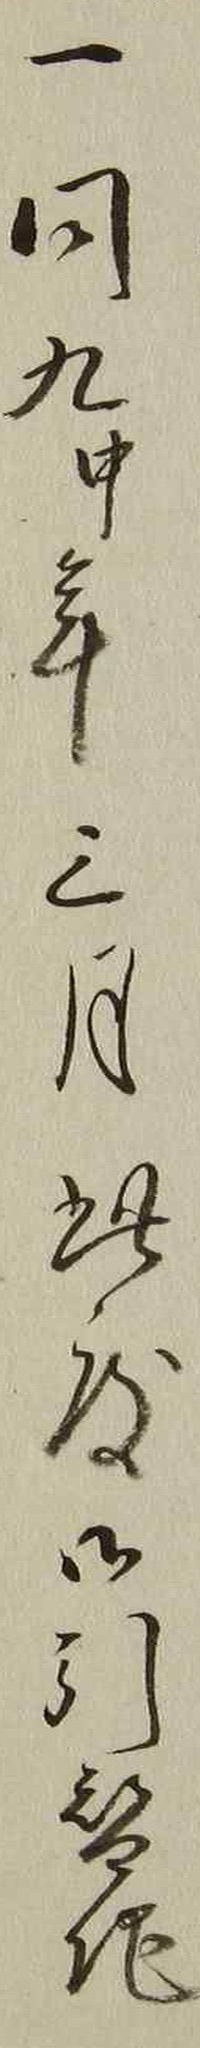一同九申年三月此度御引替地
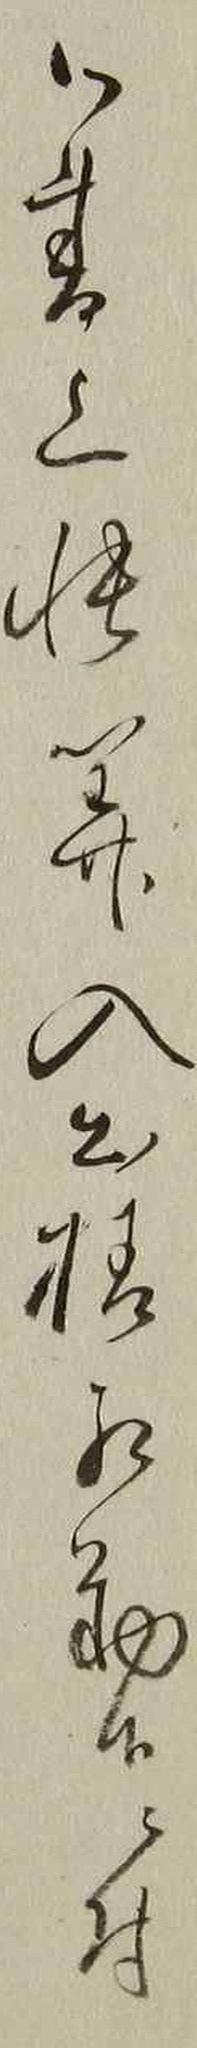御書上帳算入出精相勤候ニ付
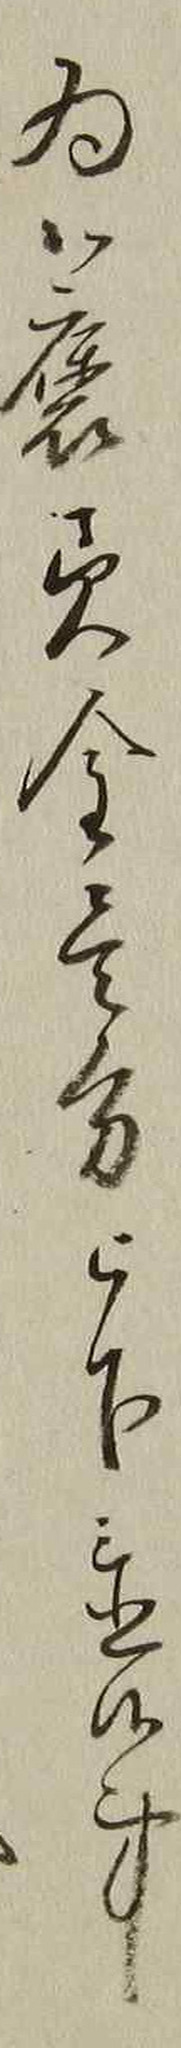為御褒美金壱分被下置候事
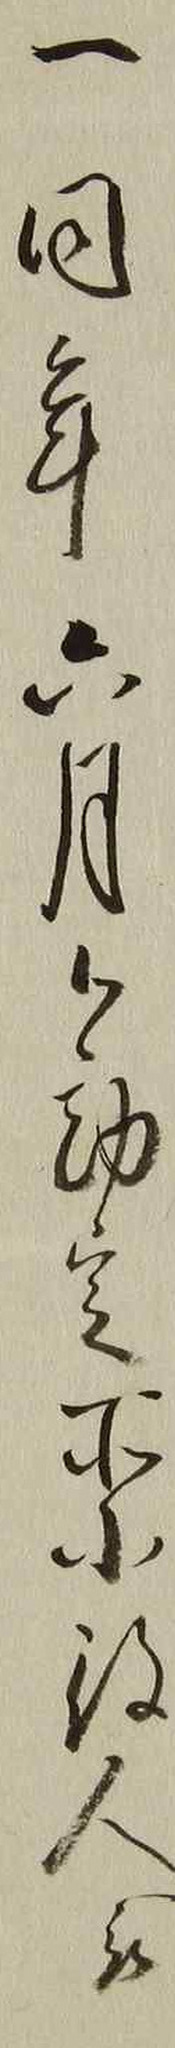一同年六月御勘定所小役人被
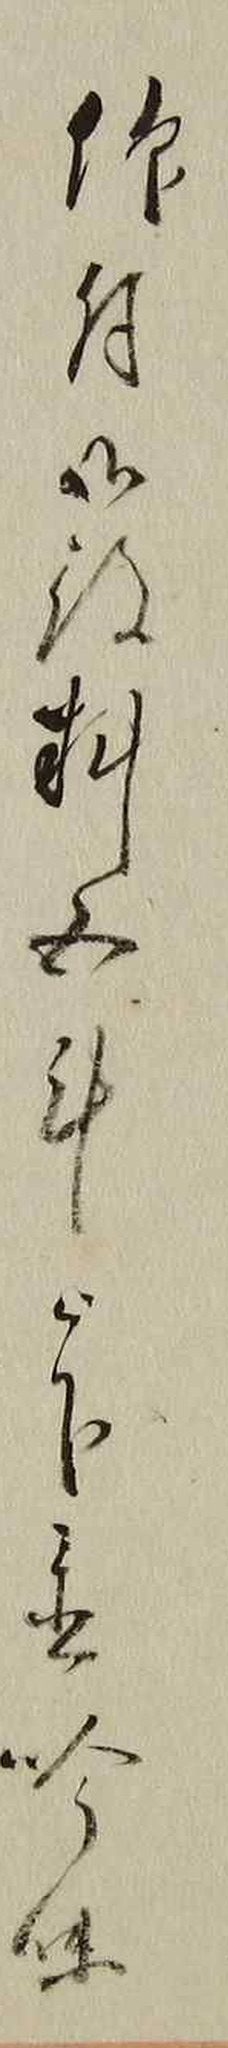仰付御役料五斗被下置吟味
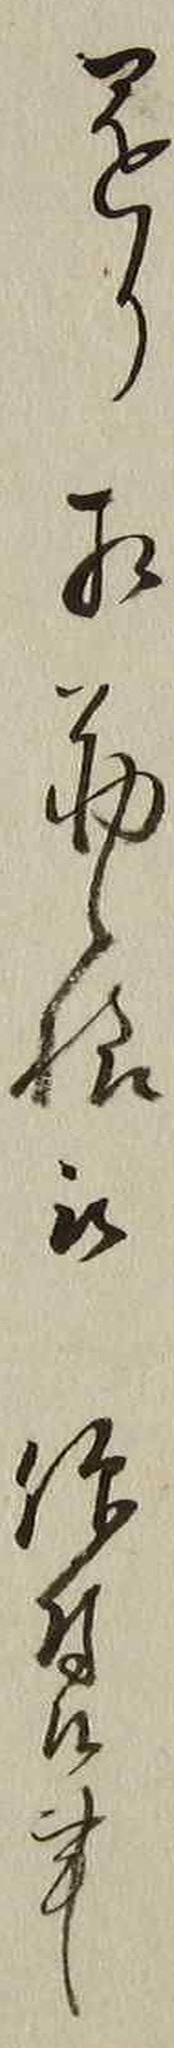懸り相勤候様被仰付候事
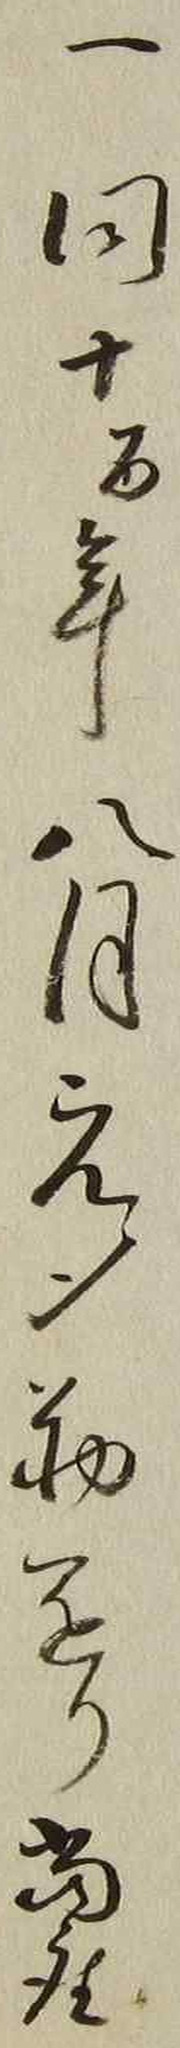一同十酉年八月元〆勤懸り当座
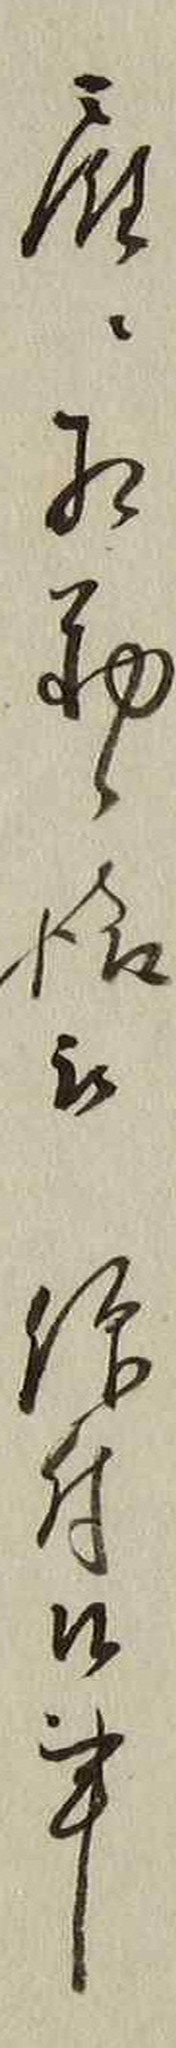雇ニ相勤候様被仰付候事
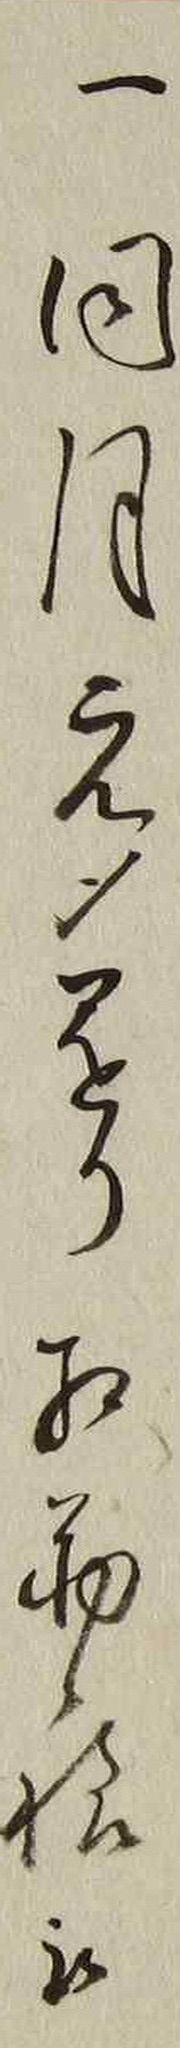一同月元〆懸り相勤候様被
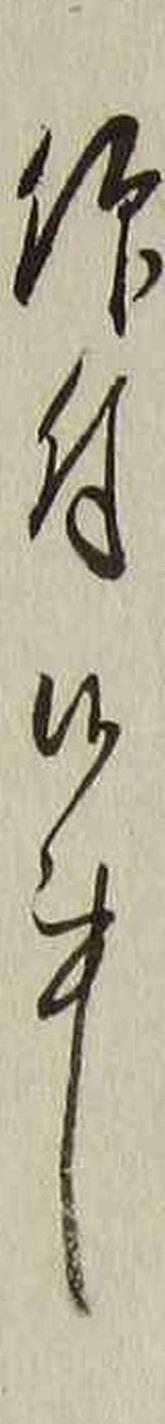仰付候事
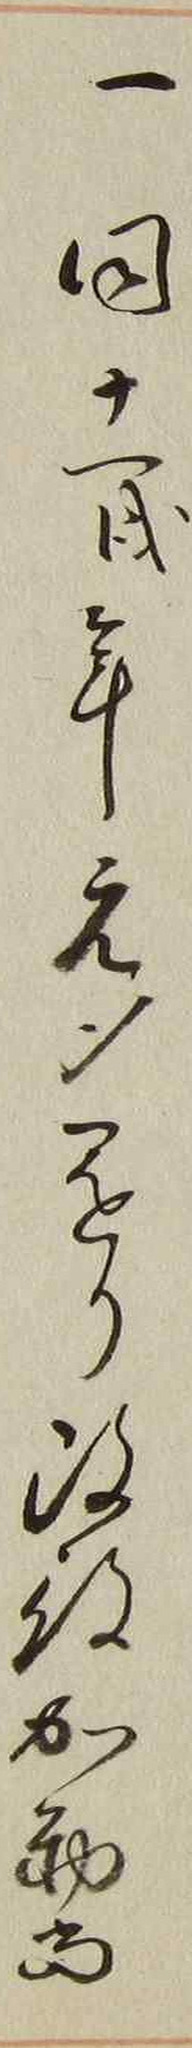一同十一戌年元〆懸り改役加勤当
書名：諸士系譜　巻之132　た之部8
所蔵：会津若松市立会津図書館
